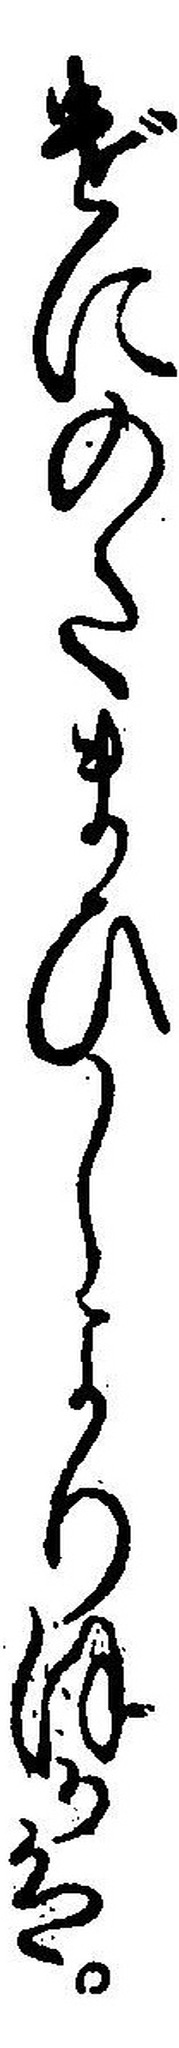げにのたまひしよりほかは。
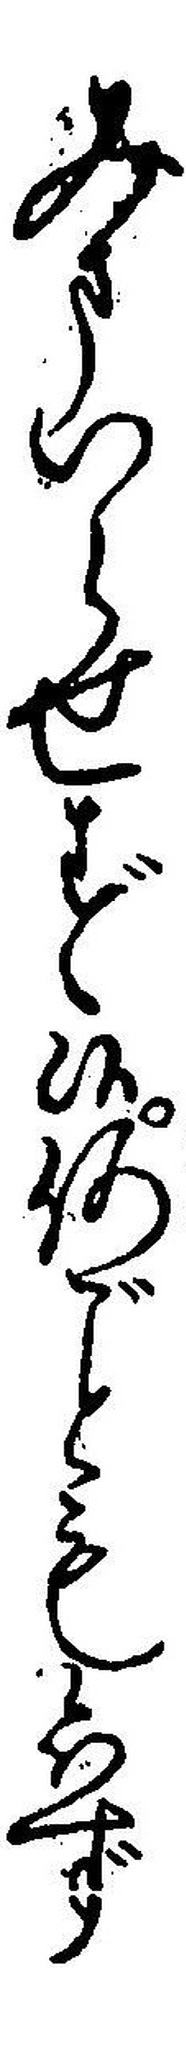みまいらせず候。何ごとも候はず
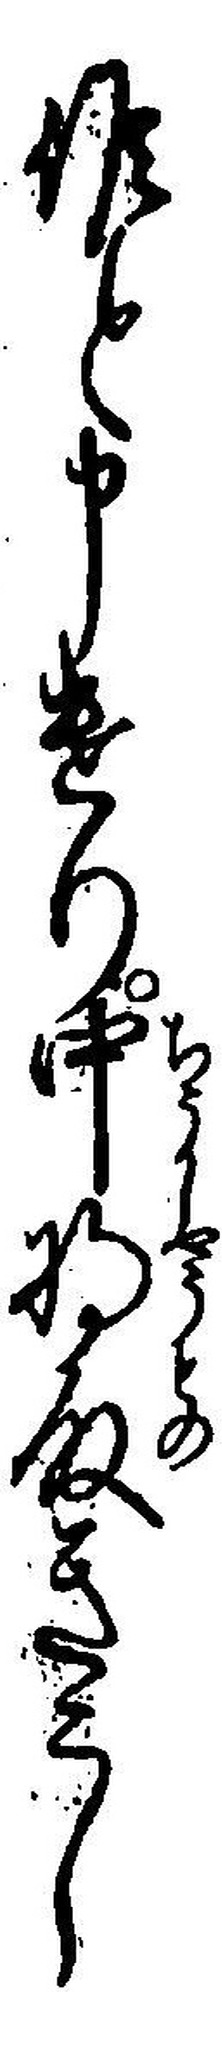候と申けり。中将殿きこし
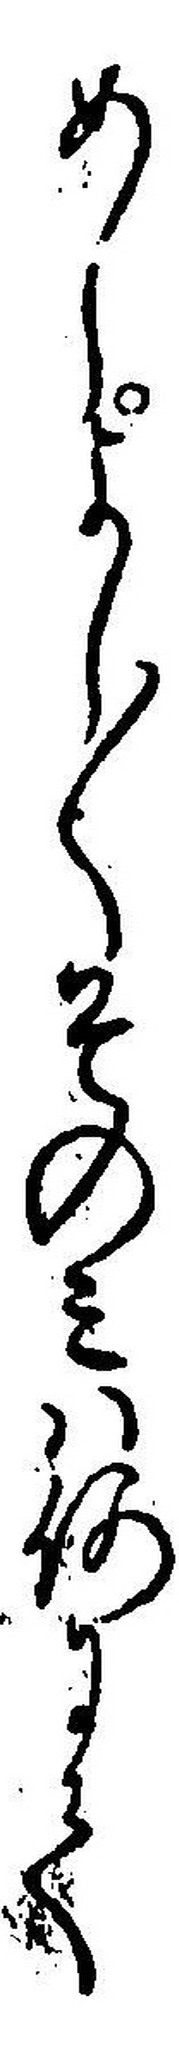めし。よし〳〵そのみは何にて
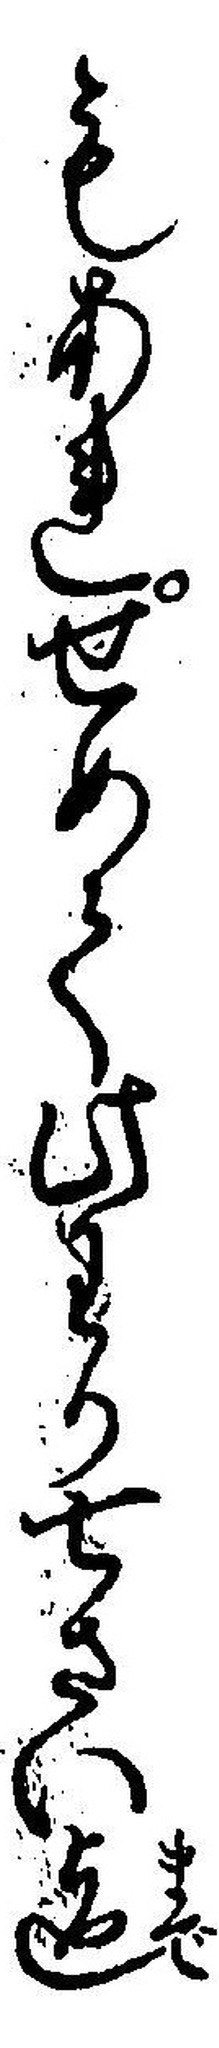もあれ。せめて此わか七さい迄
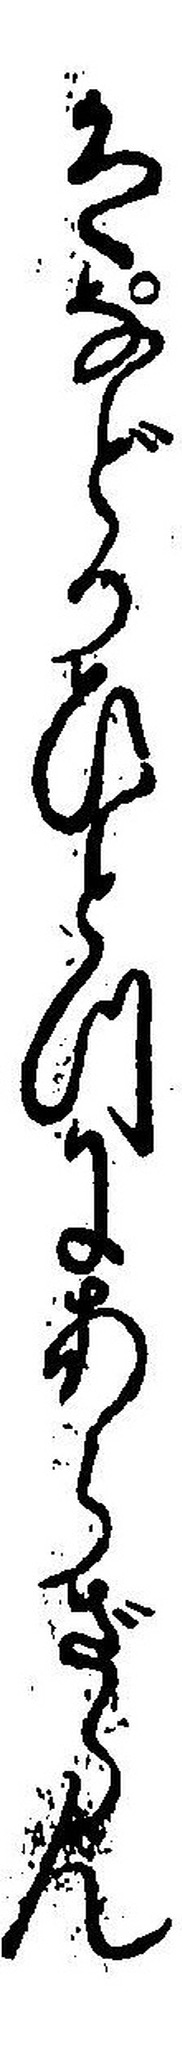は。などかひとつにあらざらん
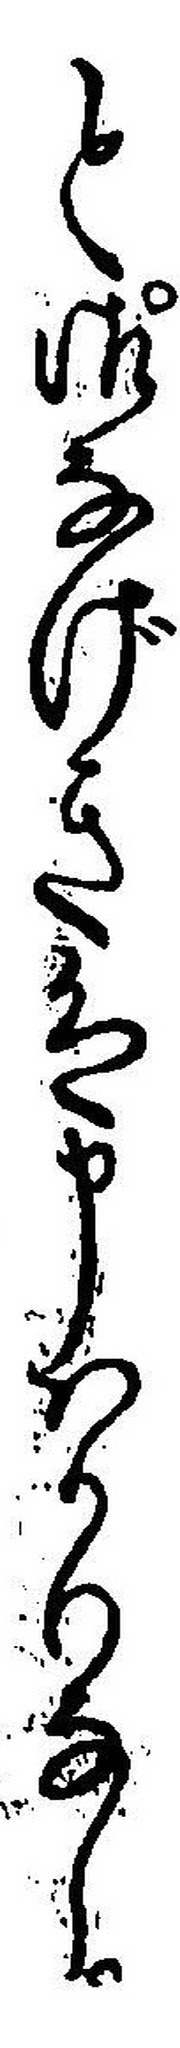と。御なげきは申はかりなし。
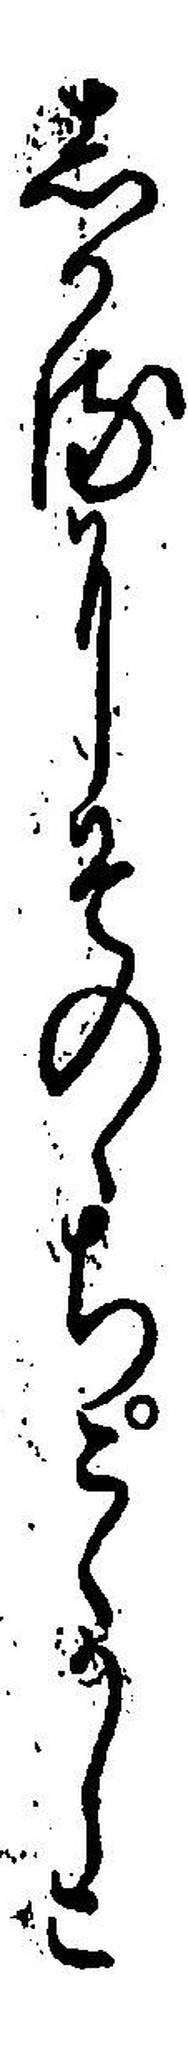しかるにそのゝち。こゝかしこ
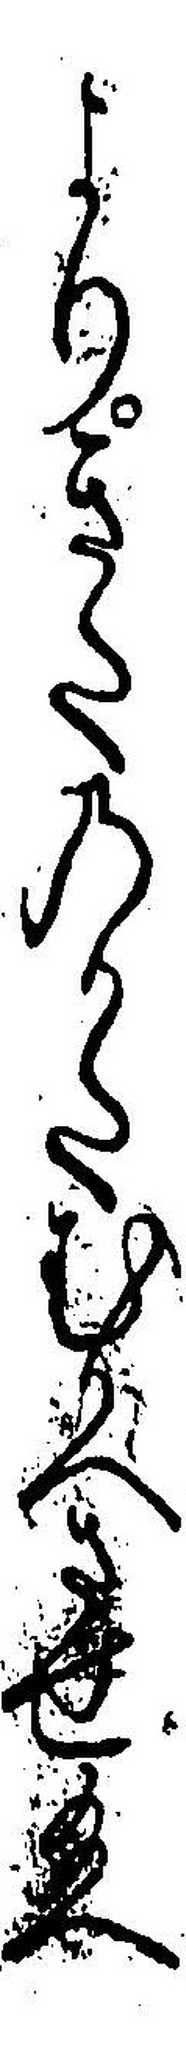より。きたのかたむかへさせ給へ
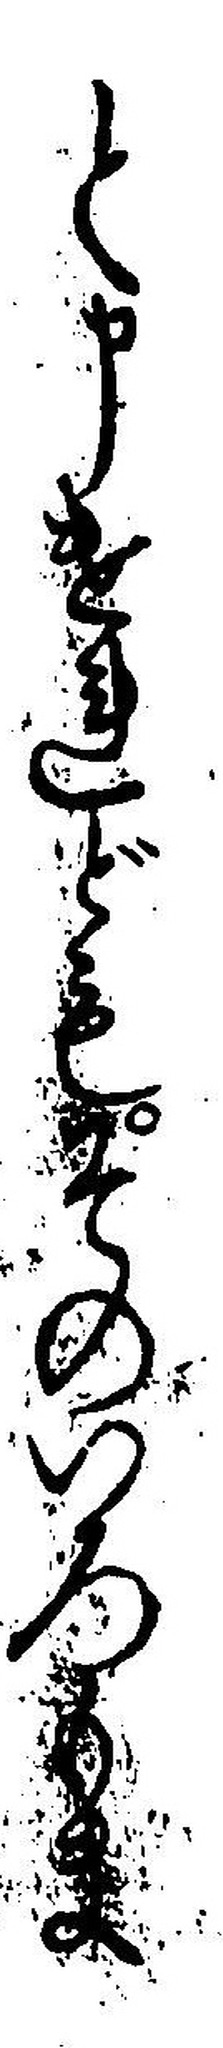と申けれども。そのいろもま
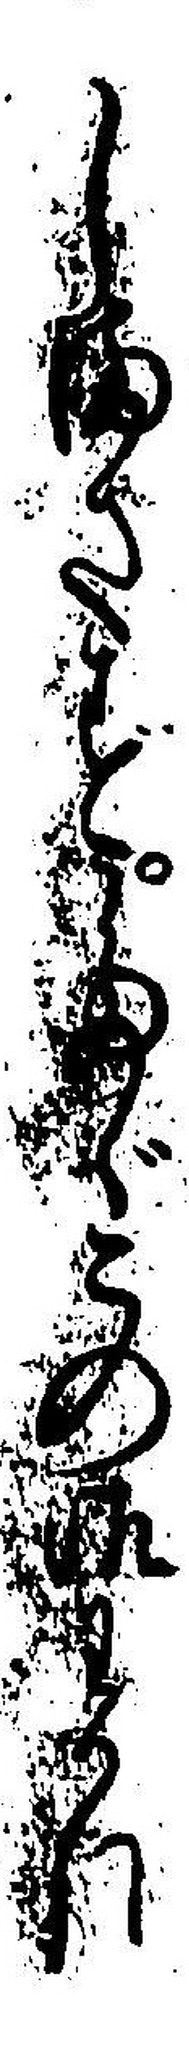しまさず。たゞこの御わかれ

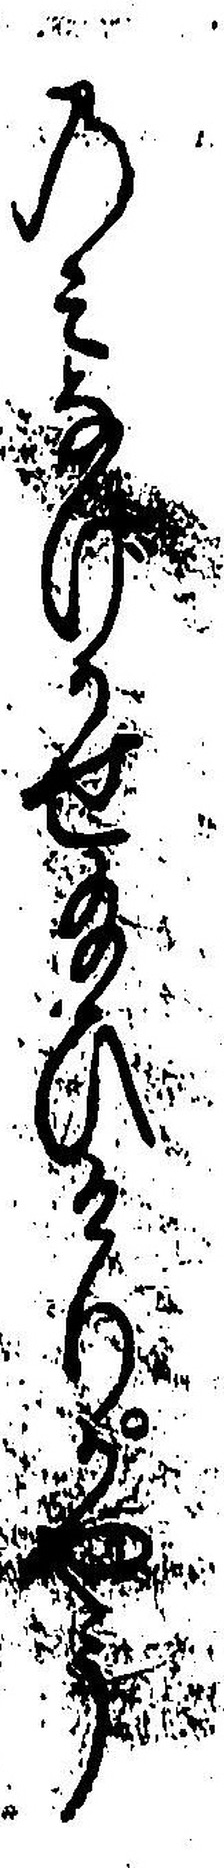のみなげかせ給ひけり。かやう
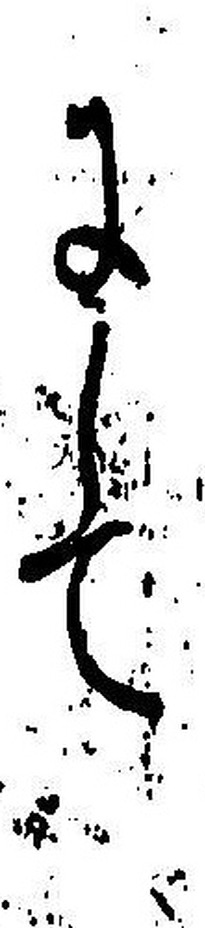にして
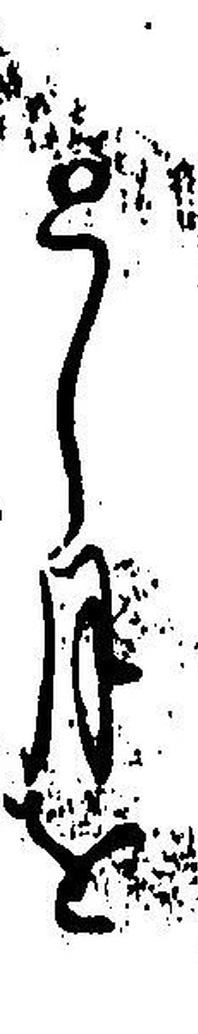とし月を
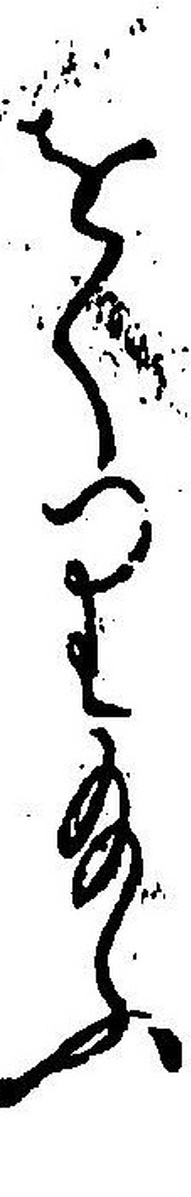をくり給ふ
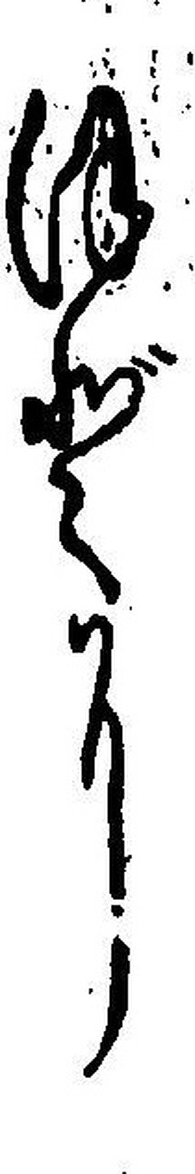ほどに
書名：木幡きつね
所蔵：東京大学総合図書館 General Library in the University of Tokyo, JAPAN
